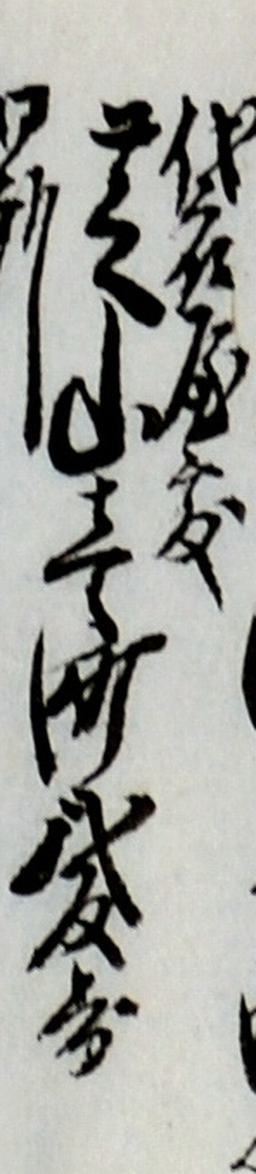芝山壱町弐反歩村中

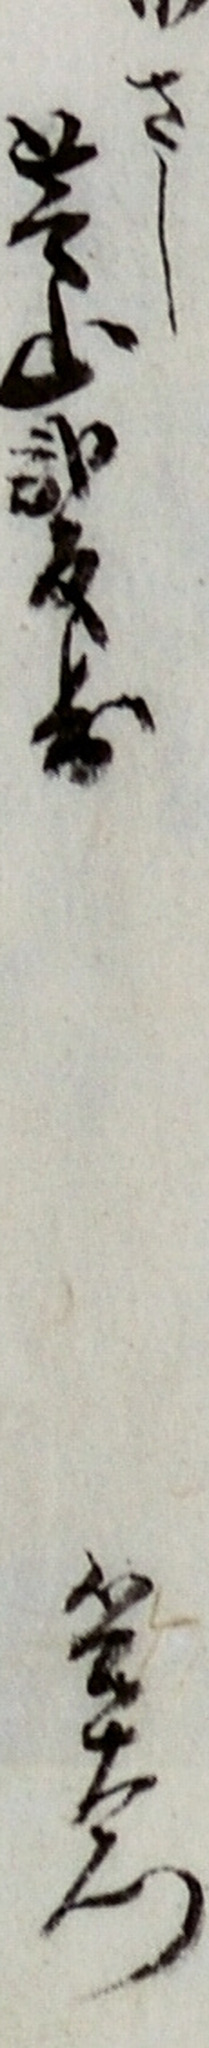芝山弐反歩兵右衛門

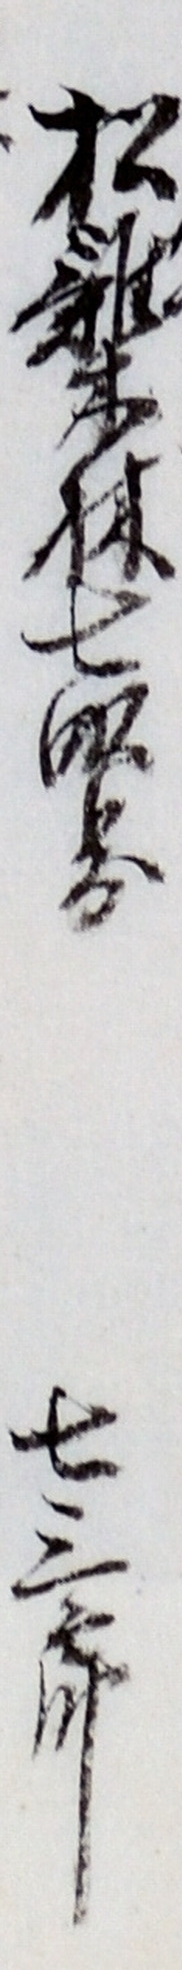松雑木林七畝歩七三郎

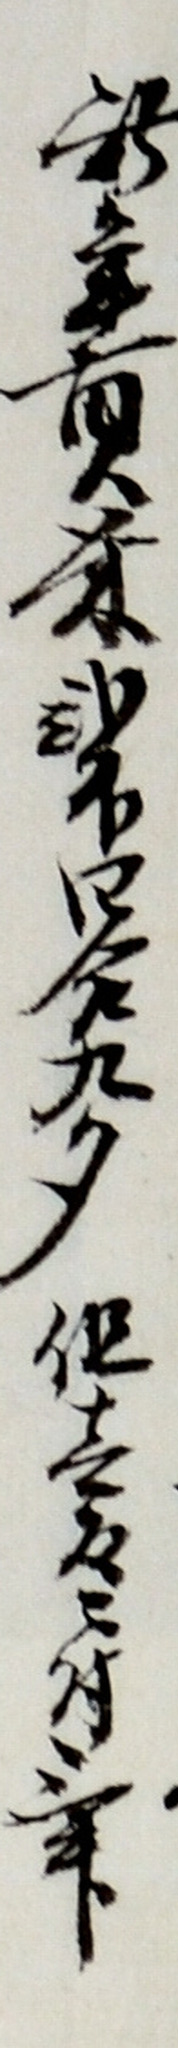此年貢米弐升四合九勺但壱反ニ付三升
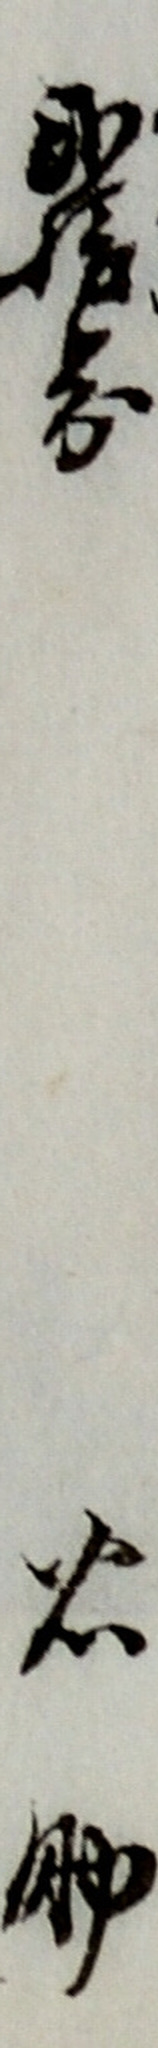弐拾歩忠助
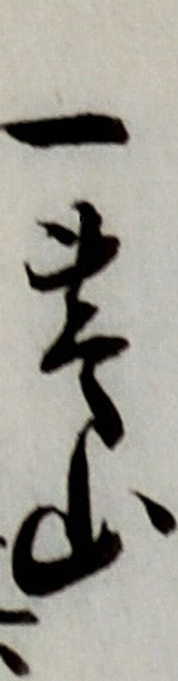一芝山
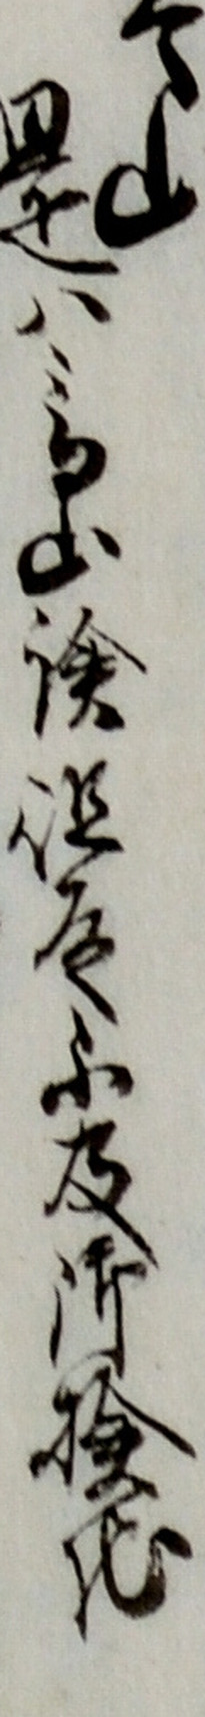是ハ高山嶮岨故不及御検地
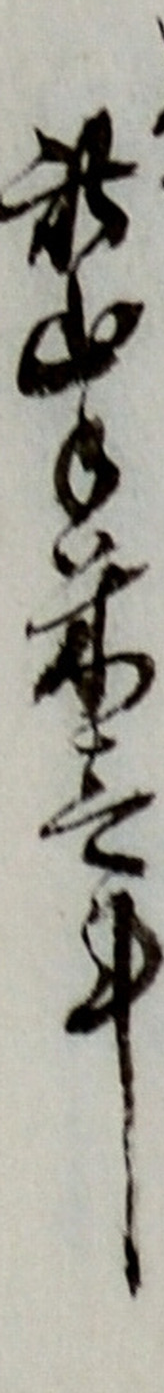此山手米壱斗

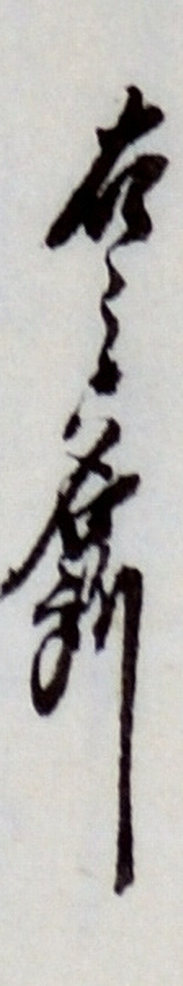右之名所
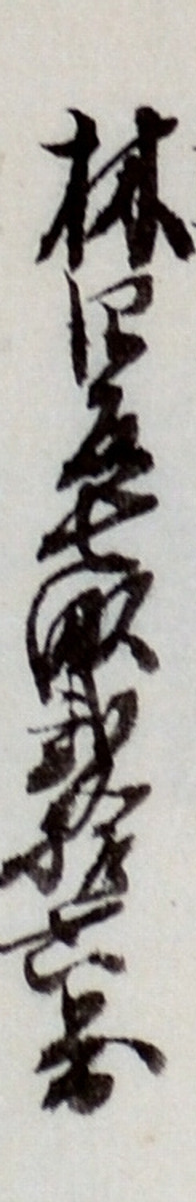林四反七畝弐拾六歩同寺
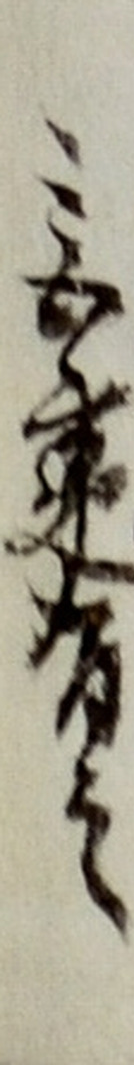宮建有之
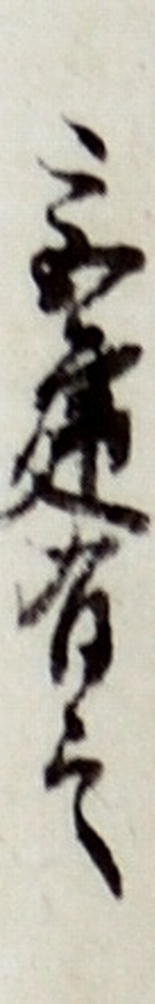宮建有之
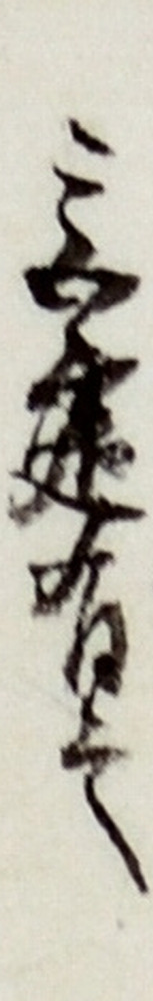宮建有之
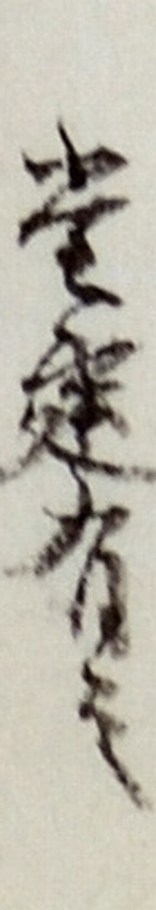堂建有之
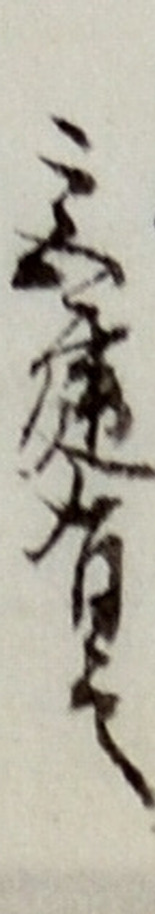宮建有之
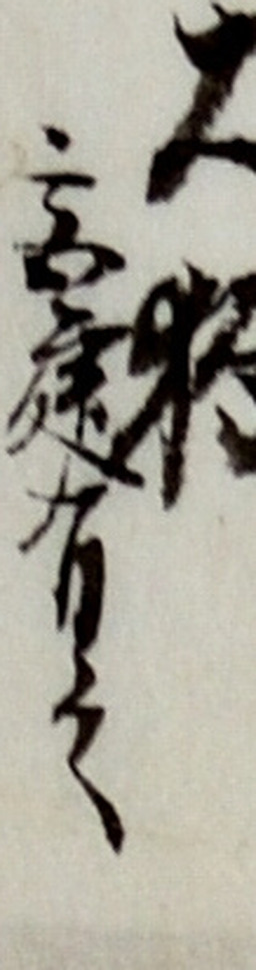宮建有之
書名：御領分中山林社地手控
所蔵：伊那市立高遠町図書館・合同会社AMANE
